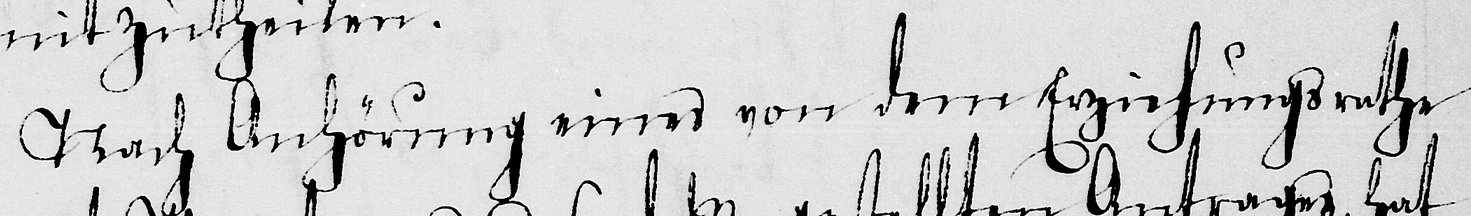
Nach Anhörung eines von dem Erziehungsrathe
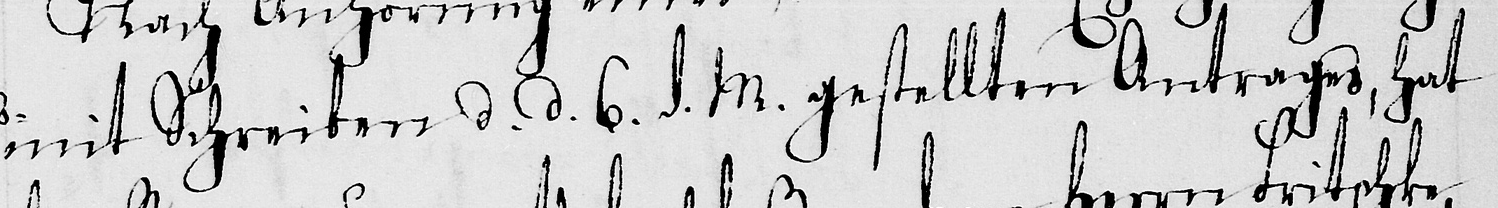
mit Schreiben d.d. 6. d. M. gestellten Antrages, hat
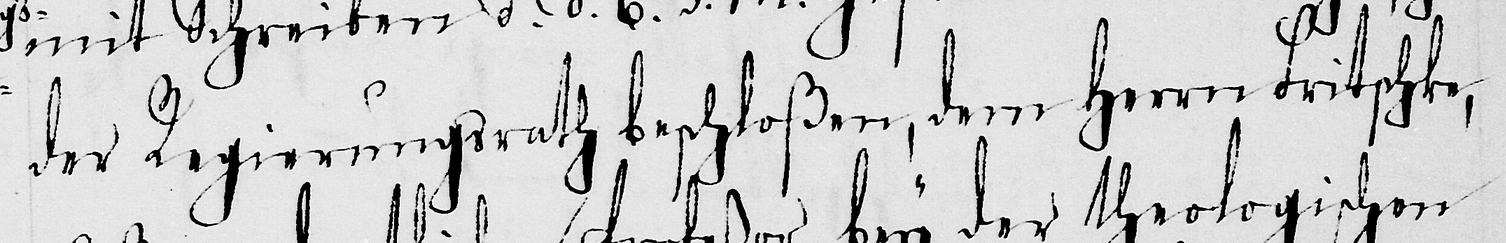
der Regierungsrath beschloßen, dem Herrn Fritschke,
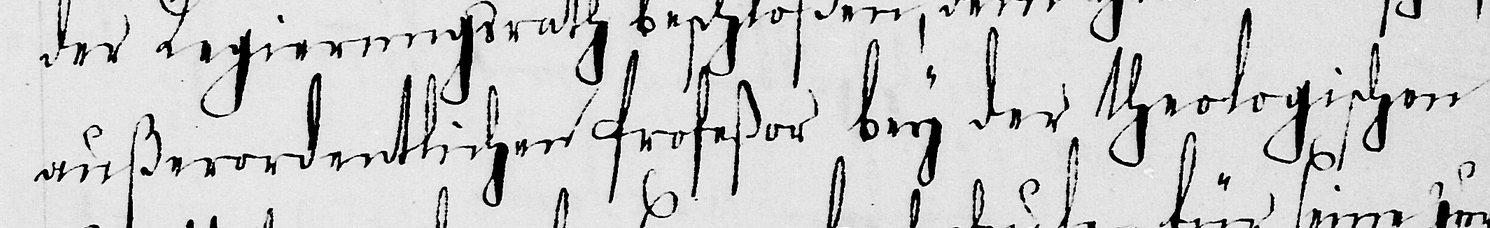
außerordentlicher Profeßor bey der theologischen
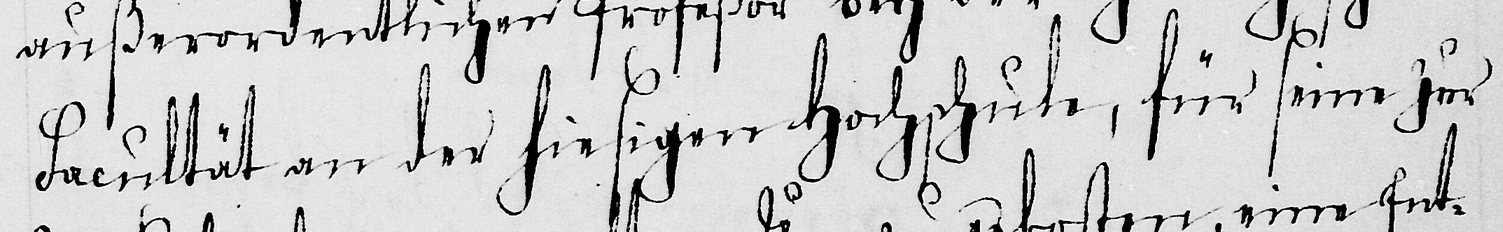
Facultät an der hiesigen Hochschule, für seine
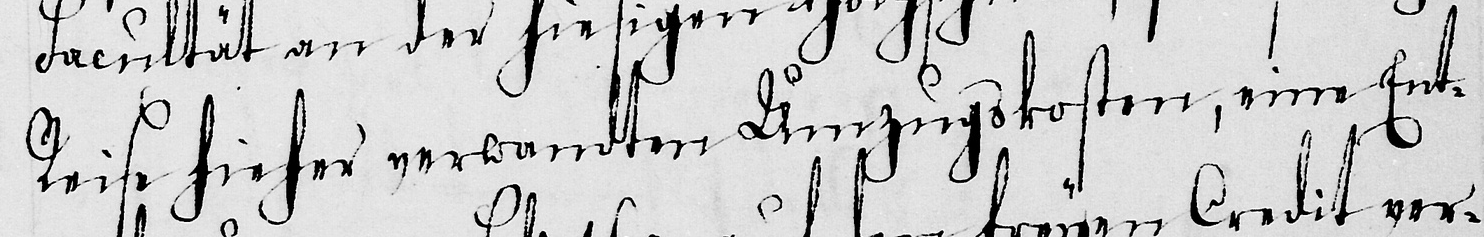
Reise hieher verwandten Umzugskosten, eine Ent¬
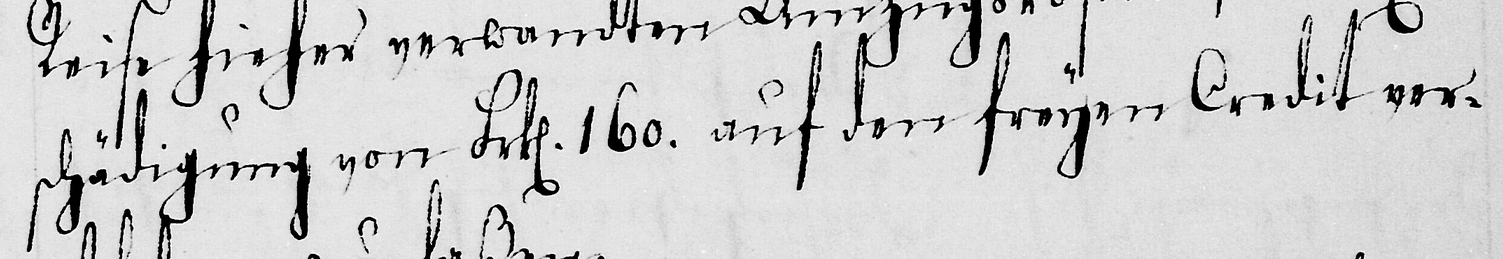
schädigung von Frk[en]. 160. auf den freyen Credit ver¬
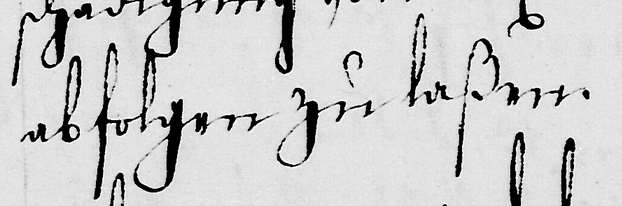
abfolgen zu laßen.
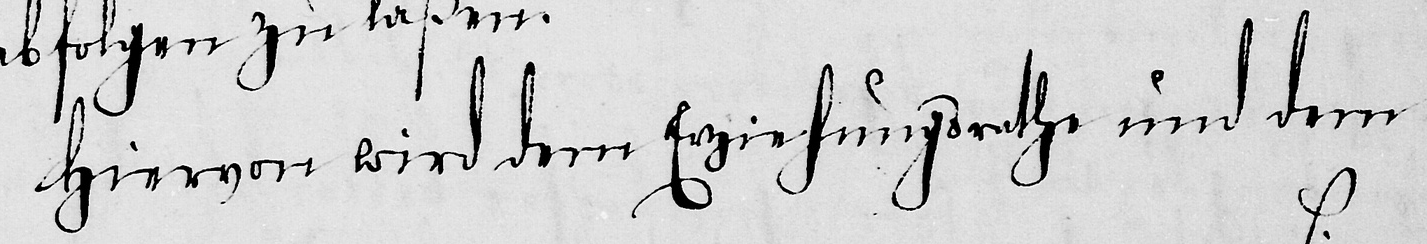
Hiervon wird dem Erziehungsrathe und dem
